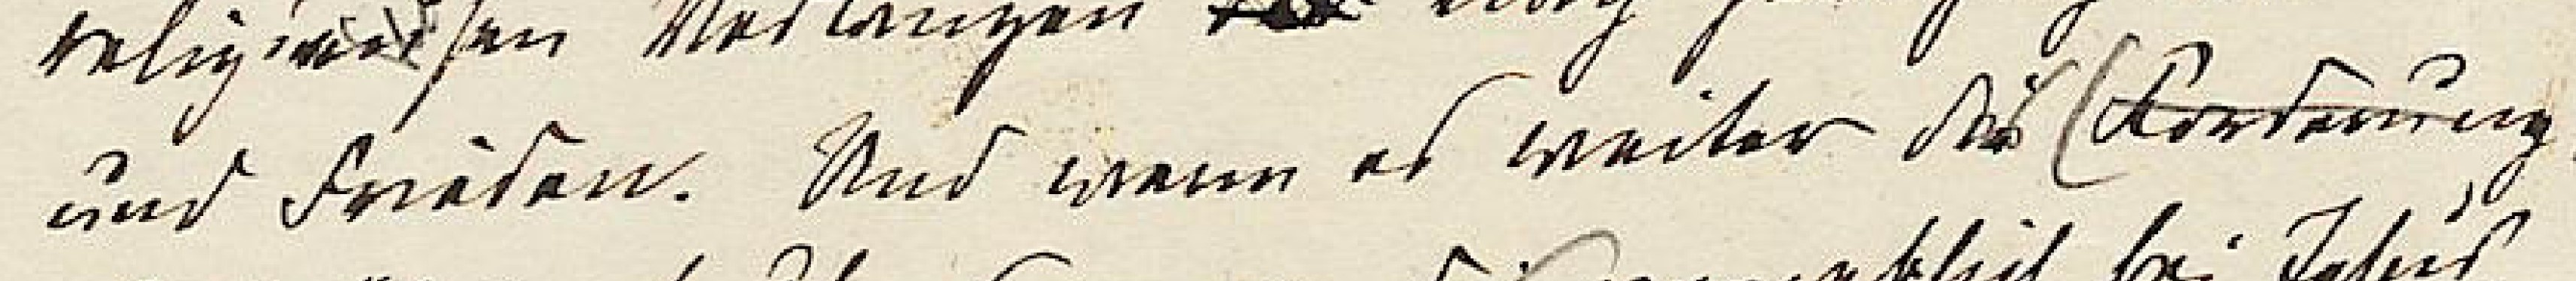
und Frieden. Und wenn es weiter des (Forderung)
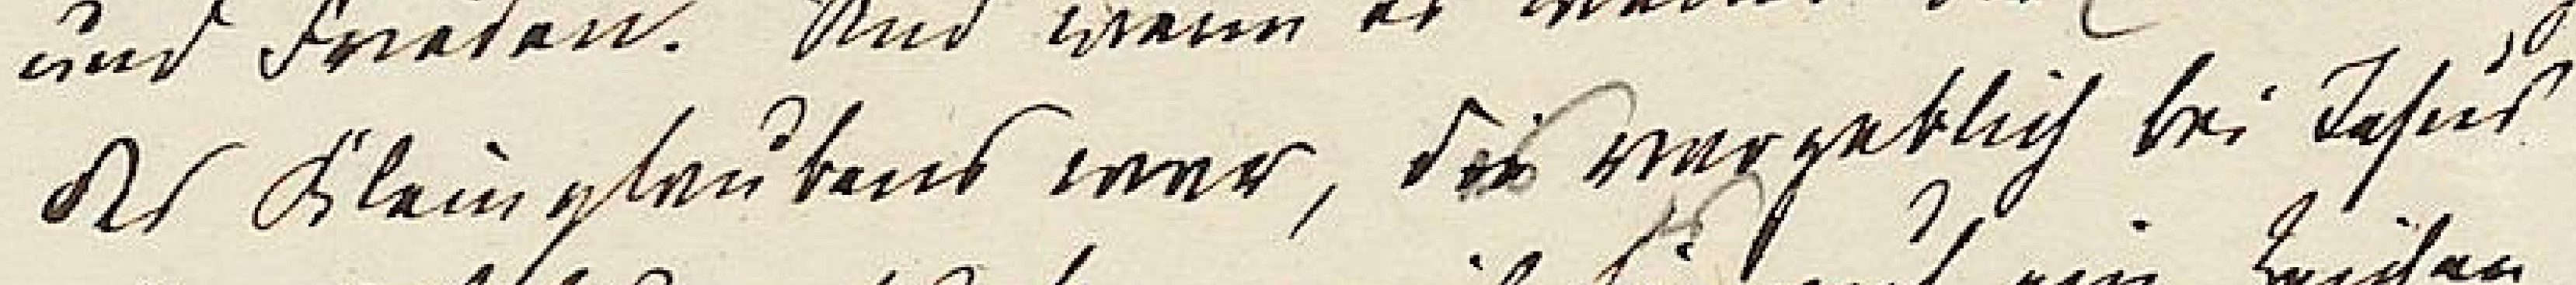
des Kleinglaubens war, das vergeblich bei Jesus
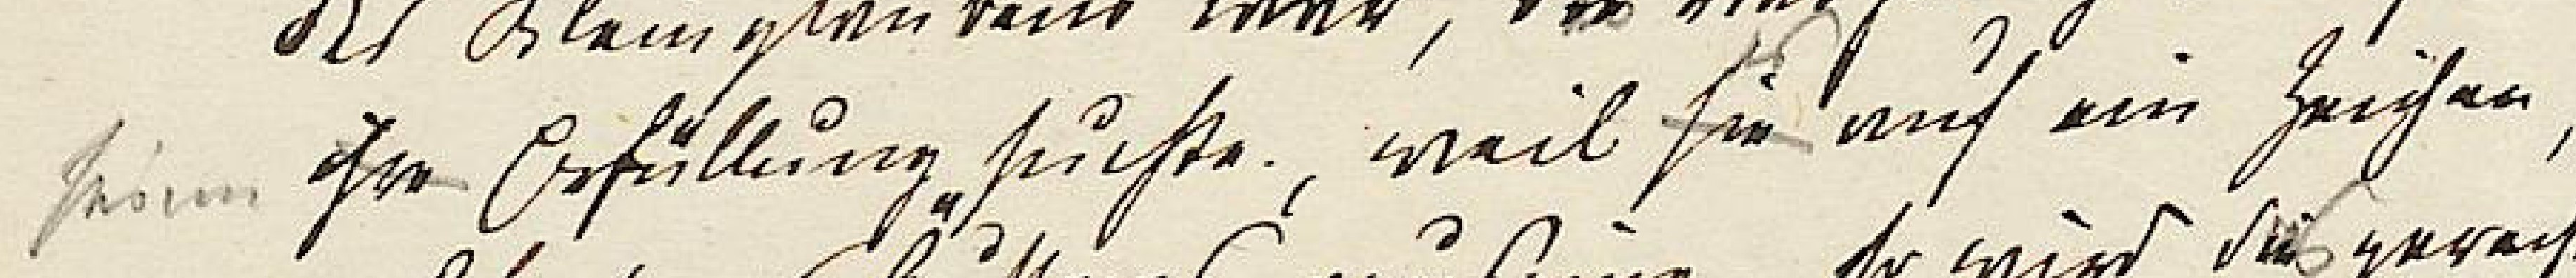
seinen ihre Erfüllung suchte, weil sie auf ein Zeichen,
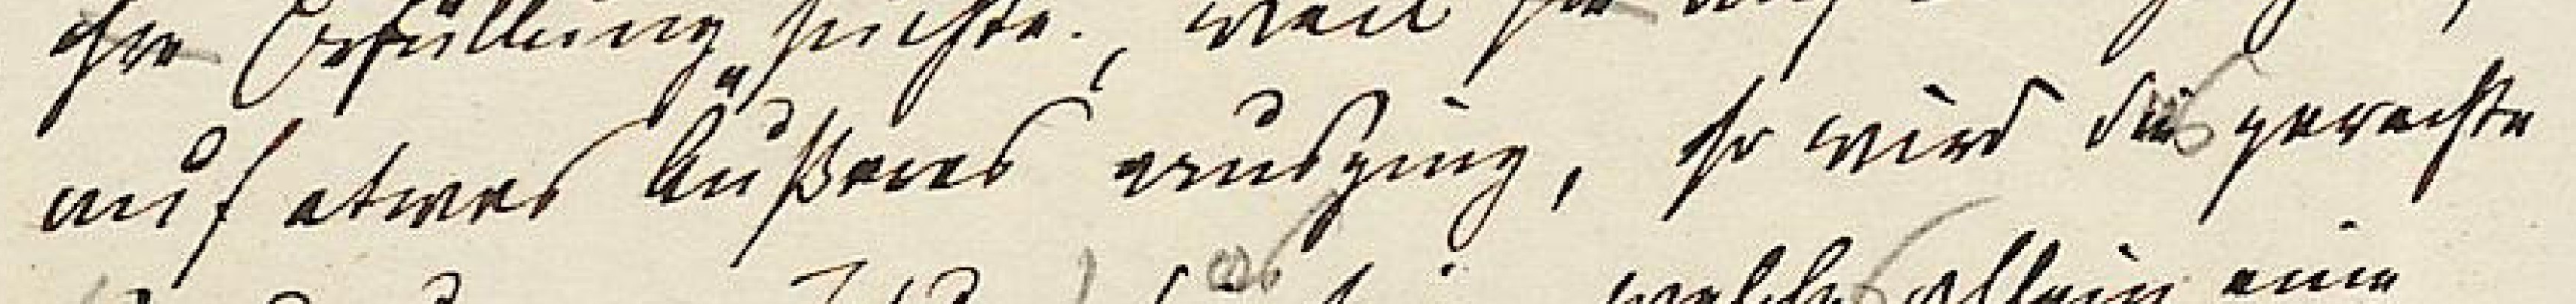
auf etwas Äußeres ausging, so wird dies gerechte
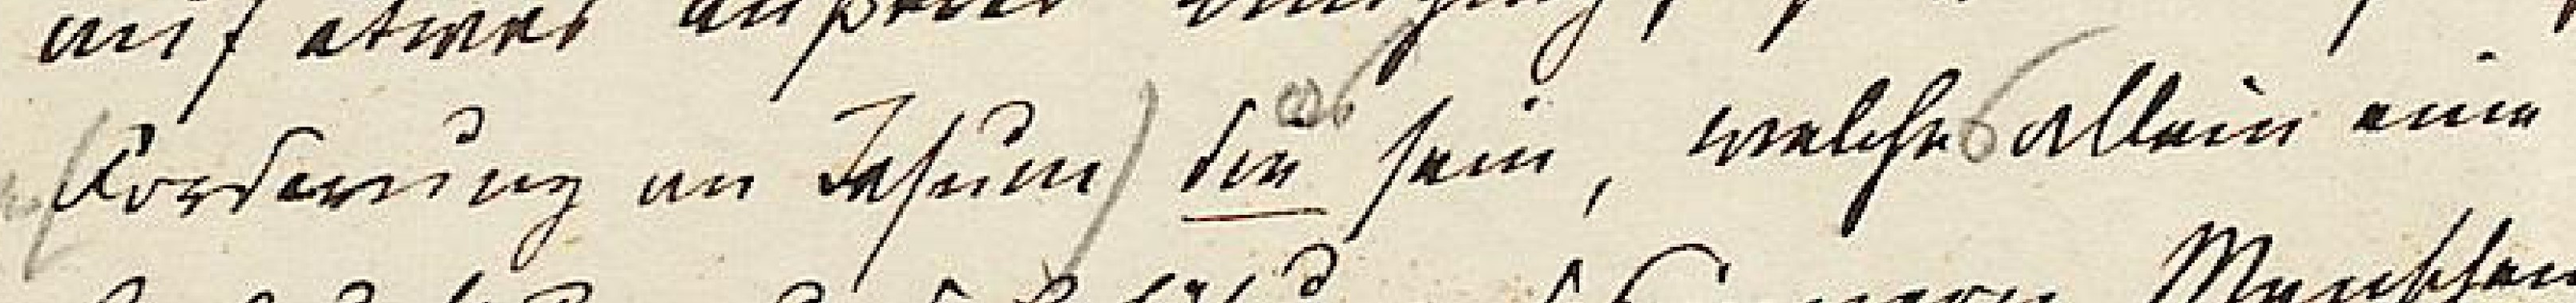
Forderunge an Jesum die sein, welches allein eine
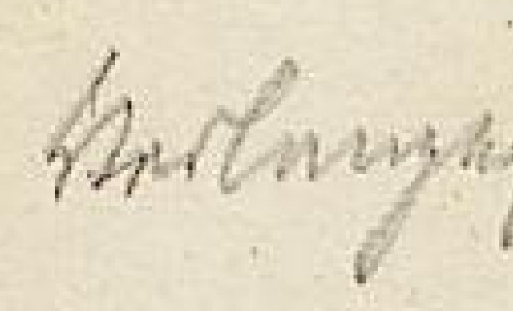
Verlangen
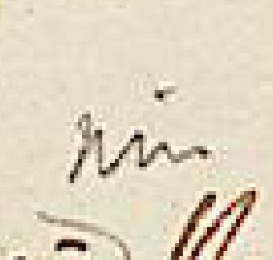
ein
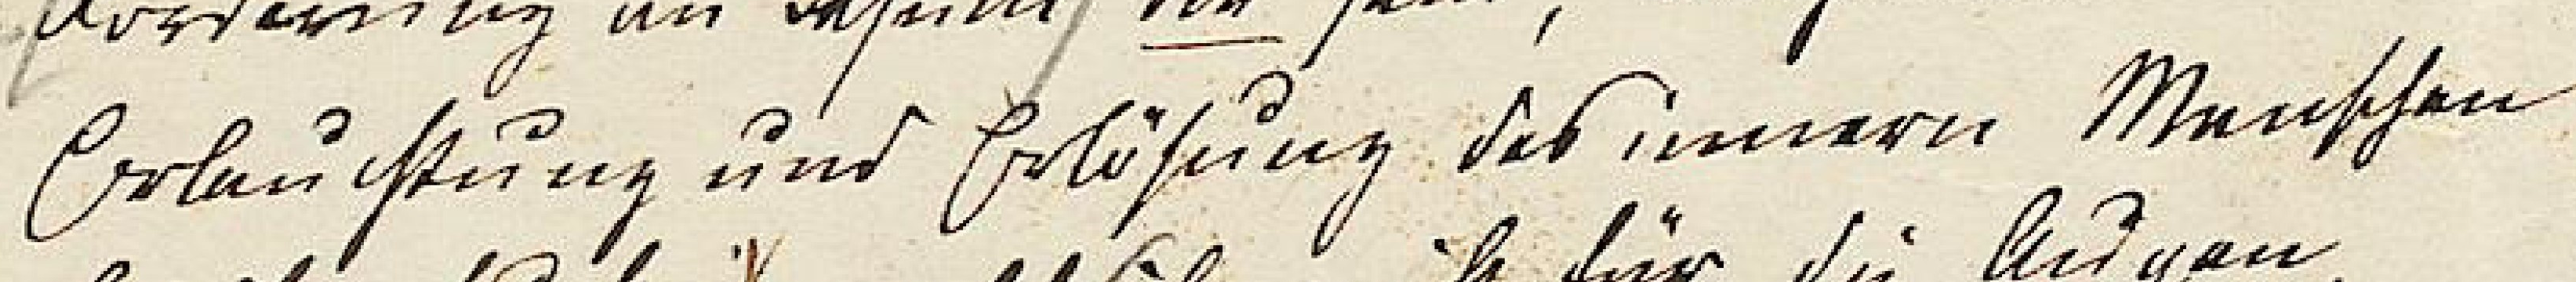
Erleuchtung und erlösung des inneren Menschen
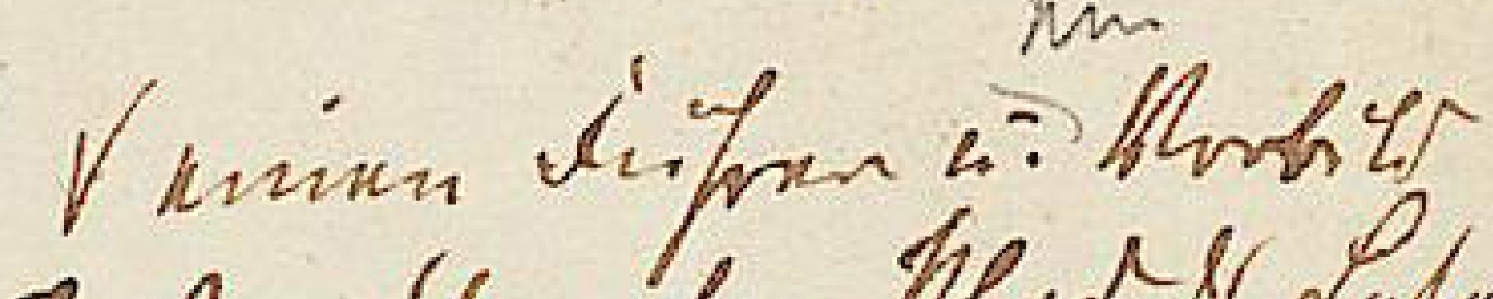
V einen Führer u. Vorbild
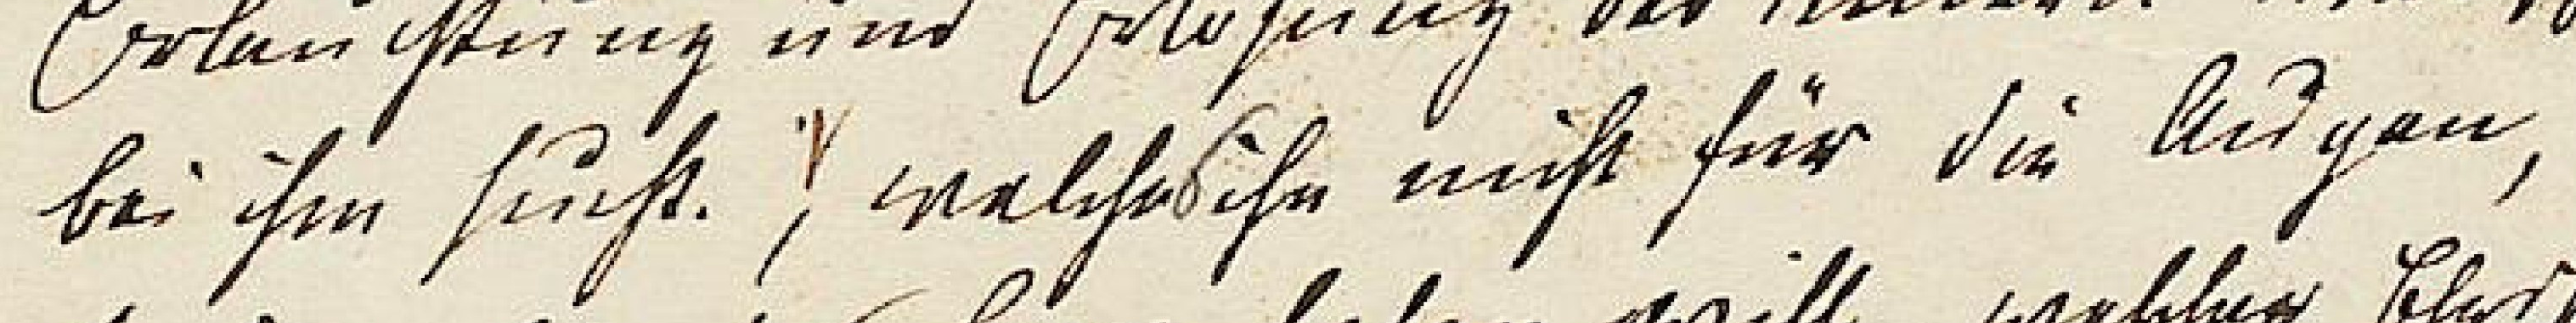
bei ihm sucht, V welches ihn nicht für die Augen,
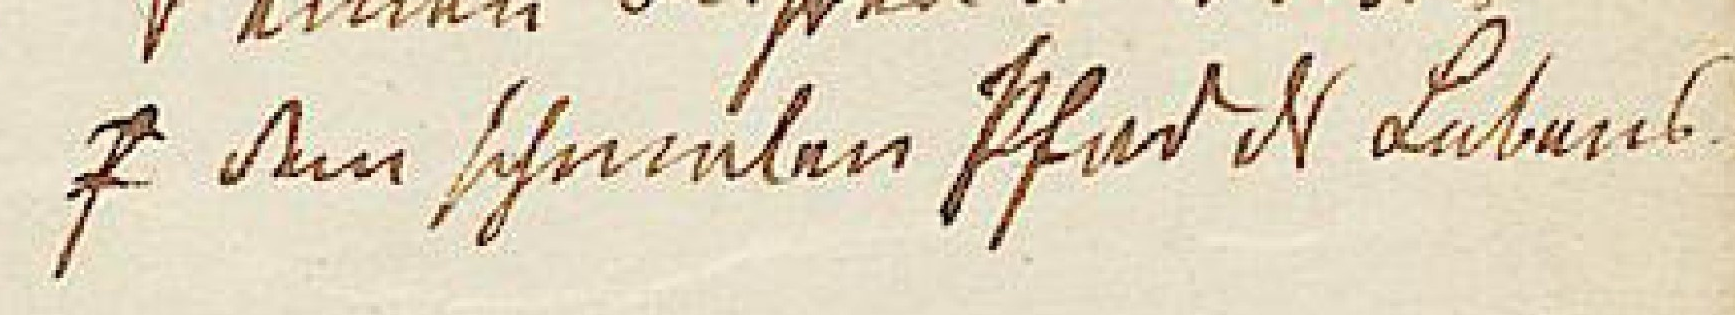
f dem schmalen Pfad des Lebens
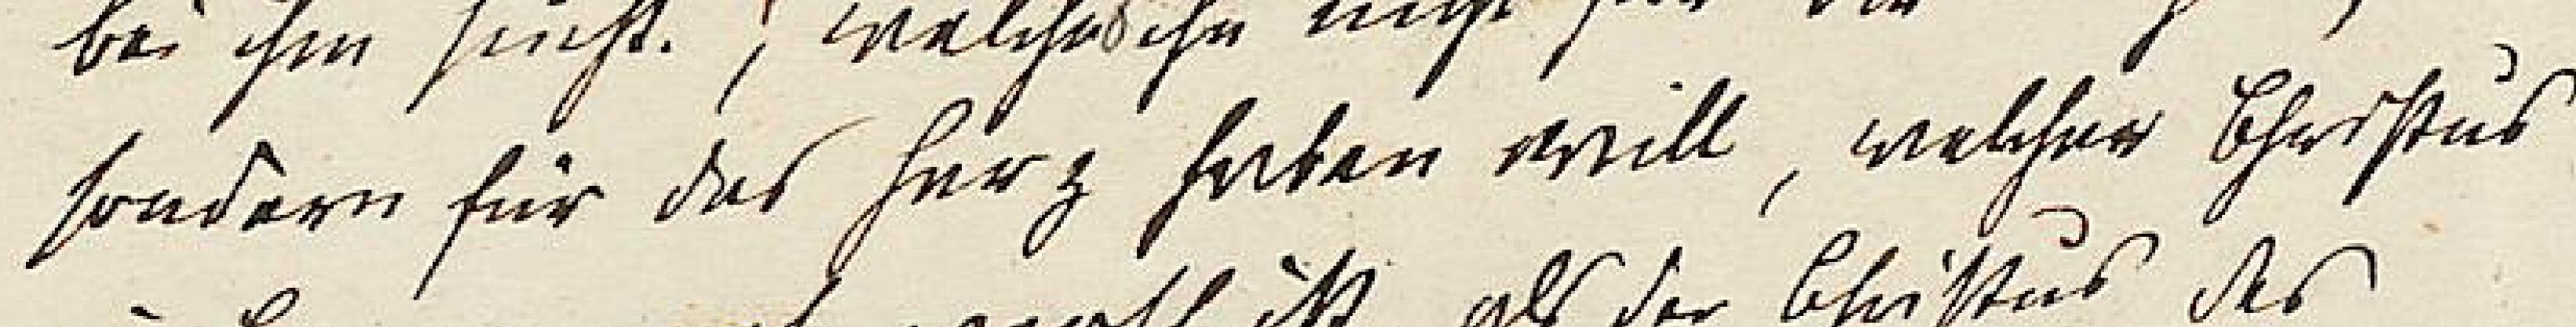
sondern für das Herz haben will, welcher Christus
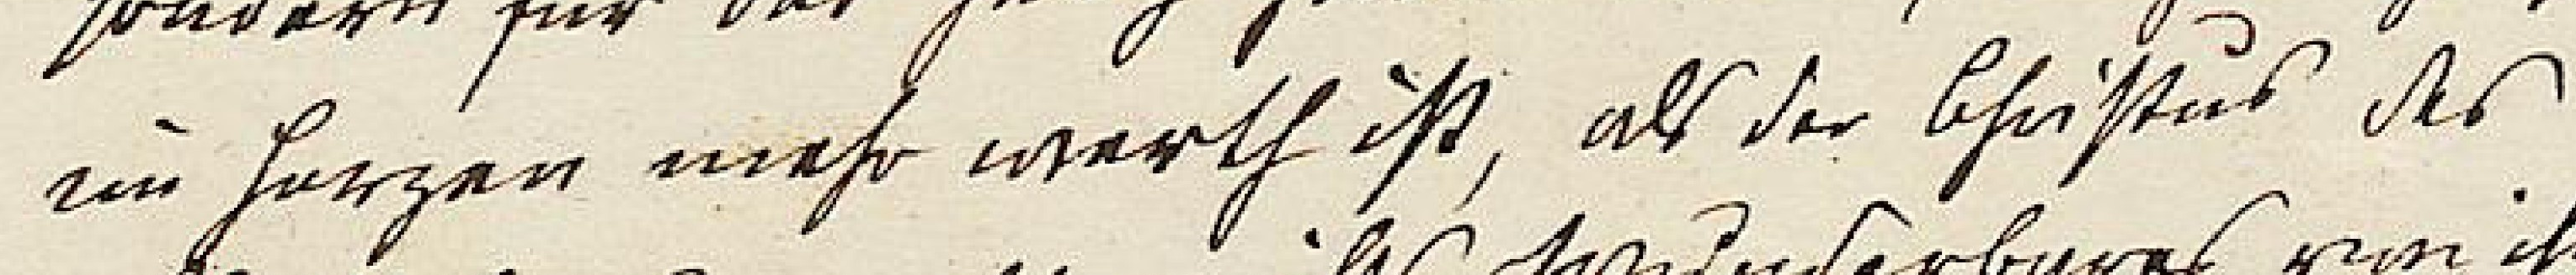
im Herzen mehr werth ist, als der Christus des
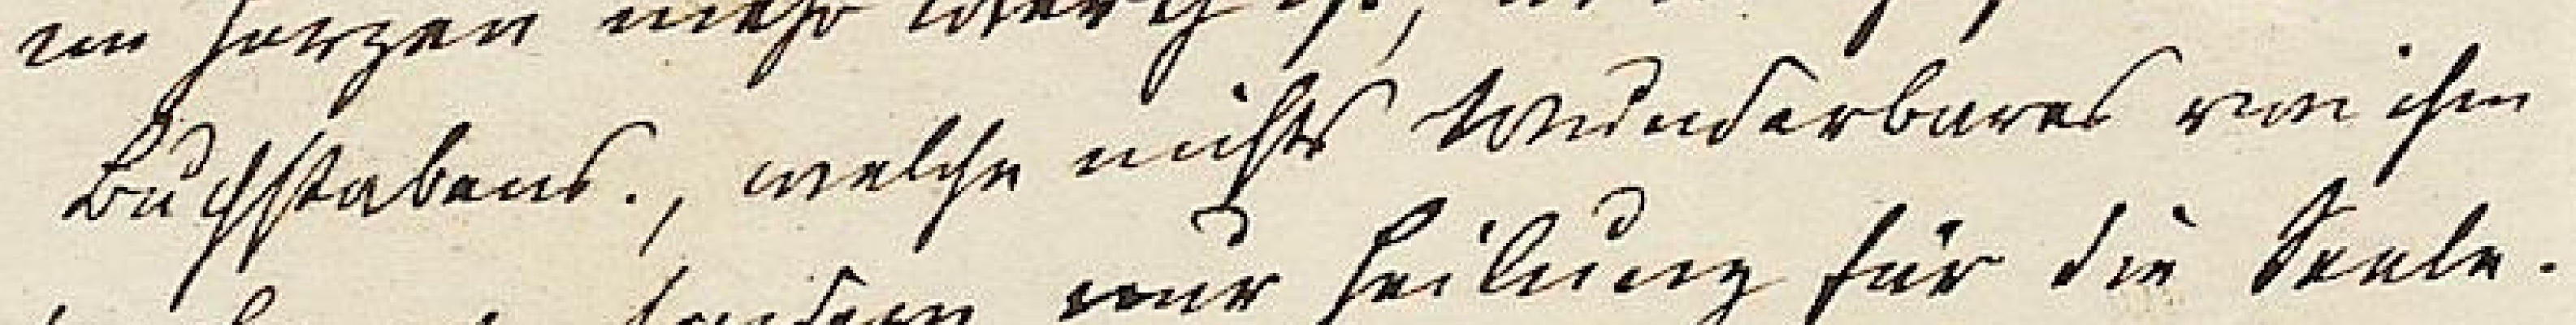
Buchstabens., welche nichts Wunderbarnes von ihnm
